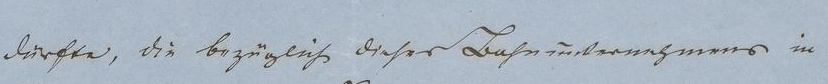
dürfte, die bezüglich dieses Bahnunternehmens in
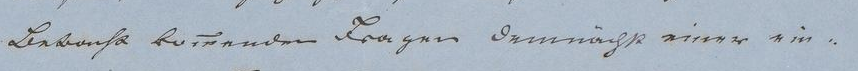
Betracht kommenden Fragen demnächst einer ein-
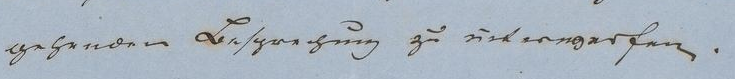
gehenden Besprechung zu unterwerfen.
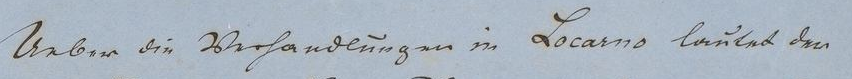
Ueber die Verhandlungen in Locarno lautet der
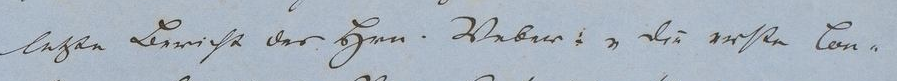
letzte Bericht des Hrn. Weber: «Die erste Con-
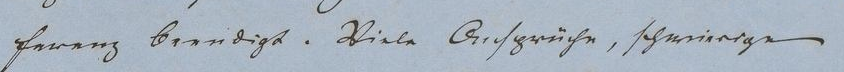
ferenz beendigt. Viele Ansprüche, schwierige
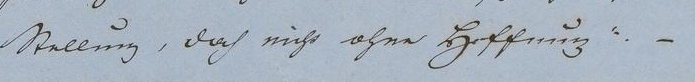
Stellung, doch nicht ohne Hoffnung». –
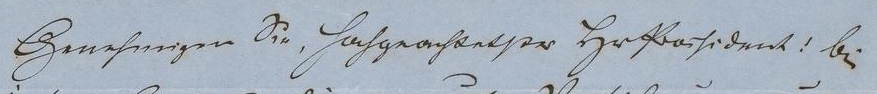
Genehmigen Sie, hochgeachtetster Hr Präsident! bei
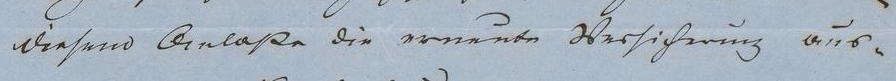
diesem Anlaße die erneute Versicherung aus-
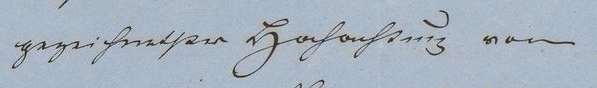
gezeichnetster Hochachtung von
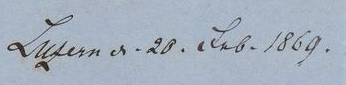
Luzern d. 20. Feb. 69.
